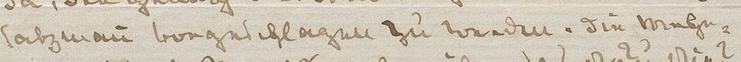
satzmann vorgeschlagen zu werden. Die Mehr-
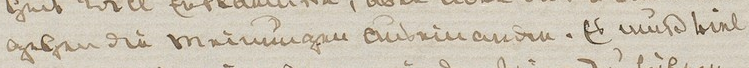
gehen die Meinungen auseinander. Es muß viel
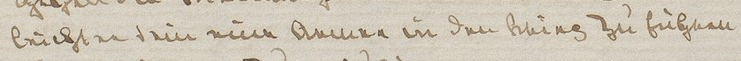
leichter sein eine Armee in den Krieg zu führen
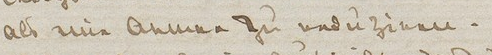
als eine Armee zu reduziren.
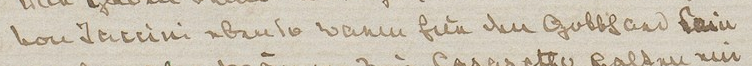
von Jaccini ebenso warm für den Gotthard sein
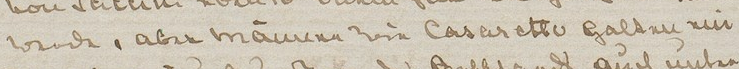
werde, aber Männer wie Casaretto halten ein
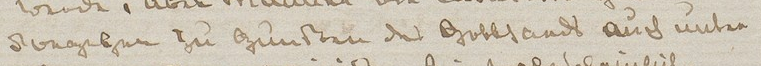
Vorgehen zu Gunsten des Gotthards auch unter
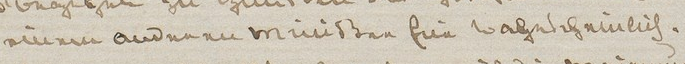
einem anderen Minister für wahrscheinlich.
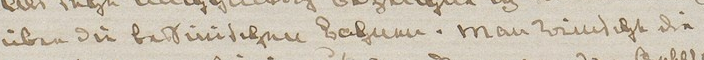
über die tessinischen Bahnen. Man wünscht die
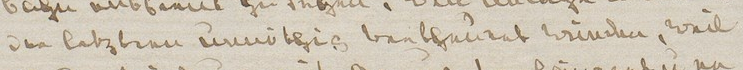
der letzteren unnöthig vertheuert würden, weil
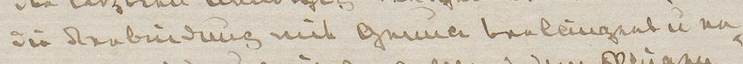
die Verbindung mit Genua verlängert u er-
